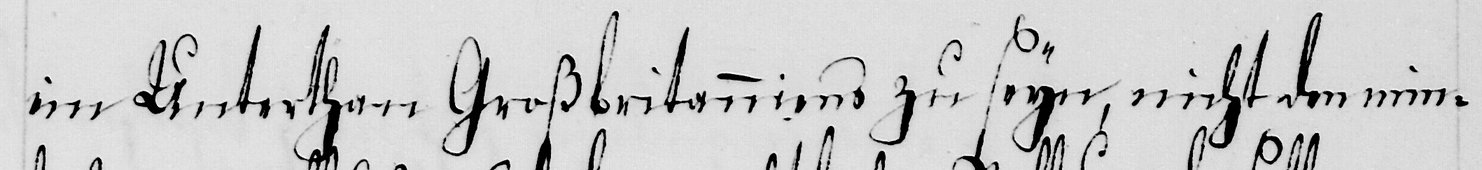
ein Unterthan Großbritanniens zu seyn, nicht den min¬
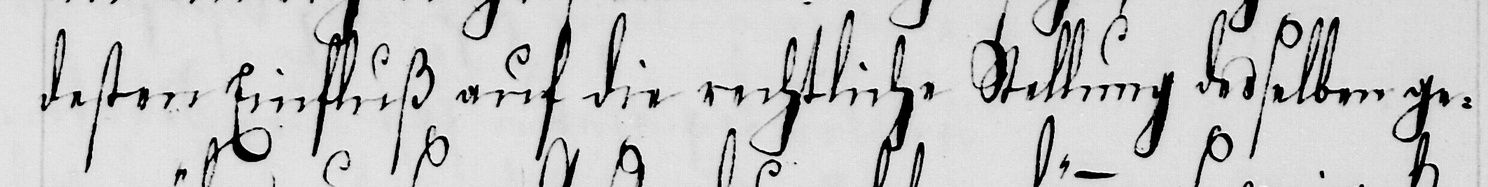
desten Einfluß auf die rechtliche Stellung desselben ge¬
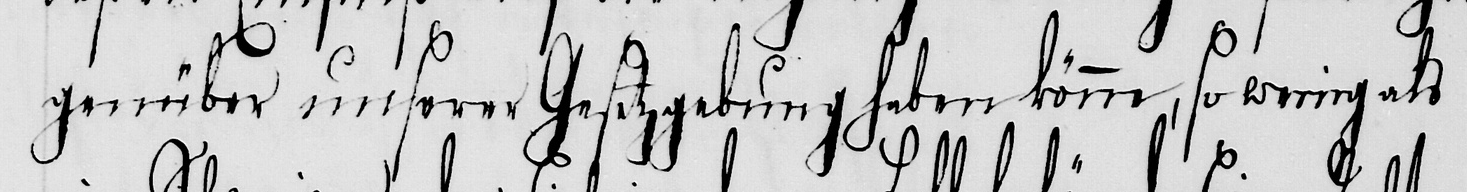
genüber unserer Gesetzgebung haben könne, so wenig als
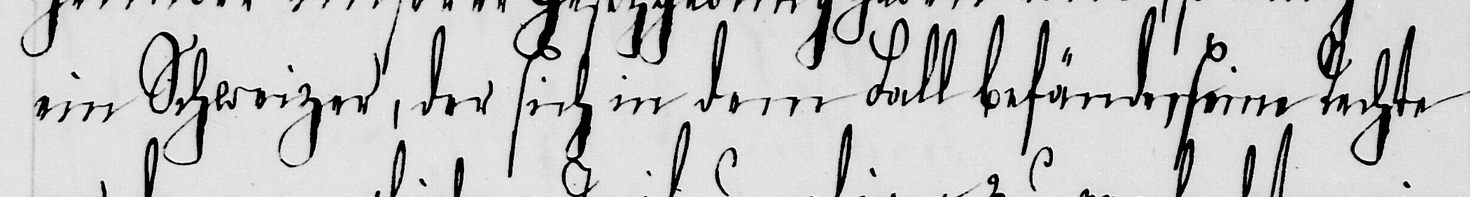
ein Schweizer, der sich in dem Fall befände, seine Rechte
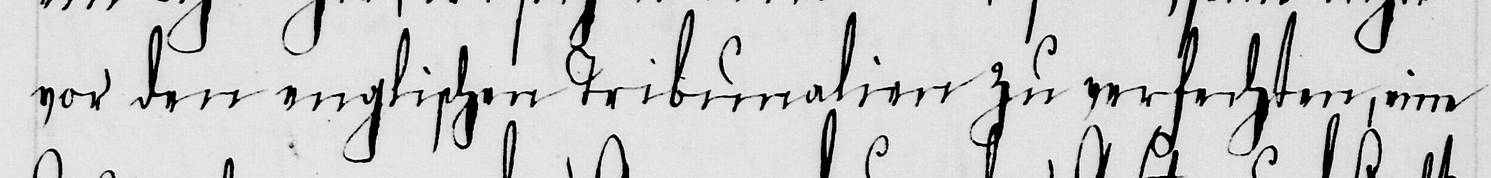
vor den englischen Tribunalien zu verfechten, eine
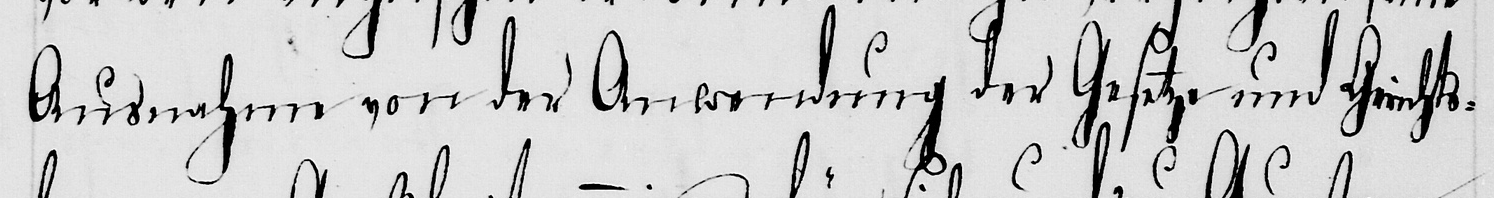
Ausnahme von der Anwendung der Gesetze und Gerich¬
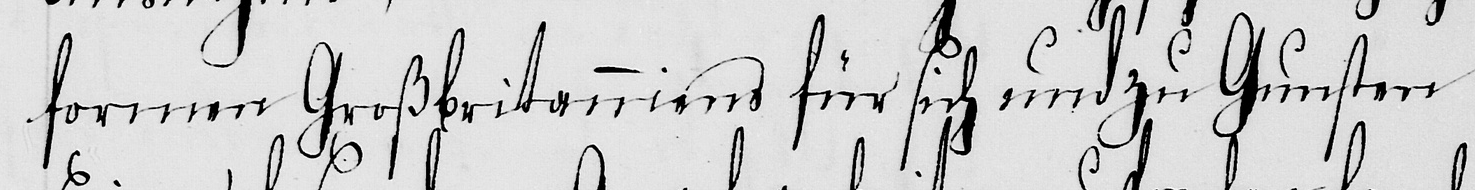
formen Großbritanniens für sich und zu Gunsten
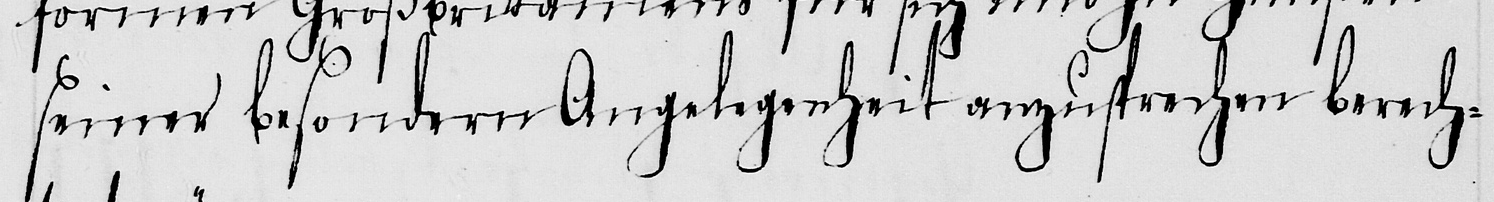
seiner besondern Angelegenheit anzusprechen berech¬
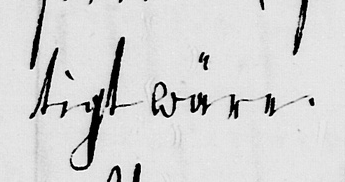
tigt wäre.
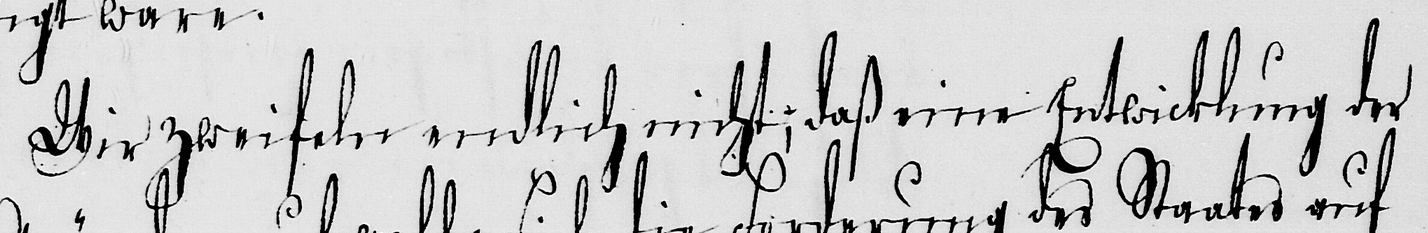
Wir zweifeln endlich nicht; daß eine Entwicklung der
